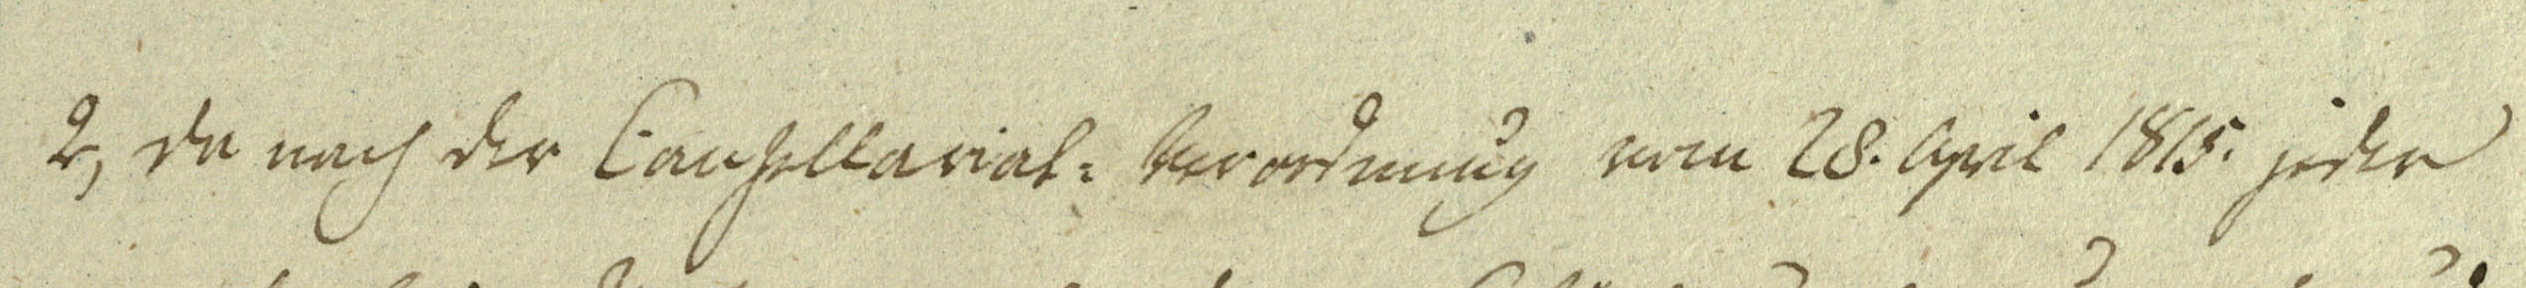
2, da nach der Canzellariat. Verordnung vom 28. April 1815 jeder
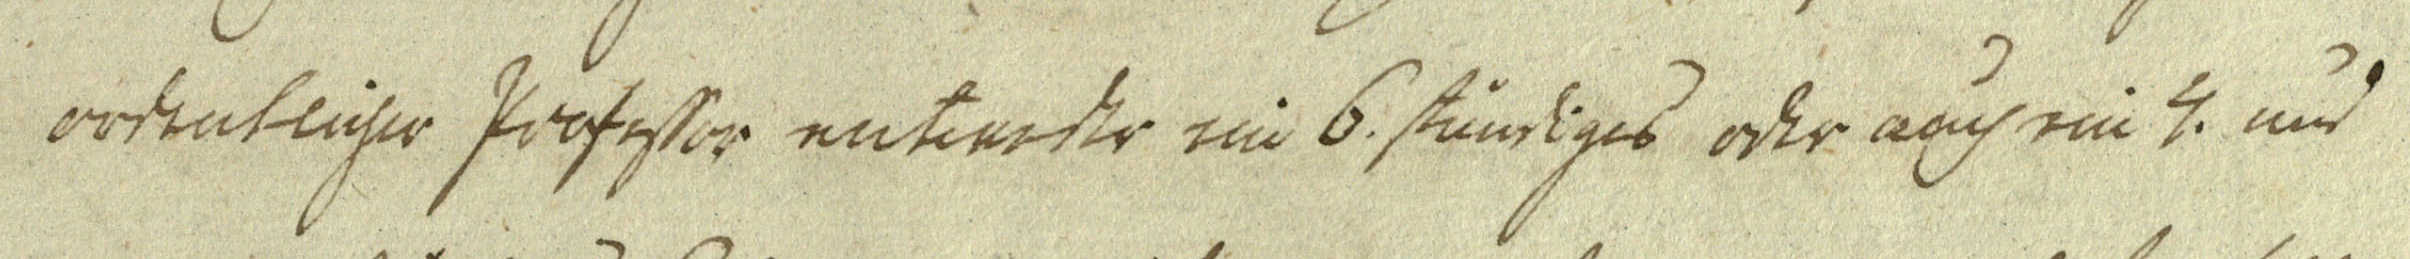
ordentlicher Professor entweder ein 6. stündiges oder auch ein 4. und
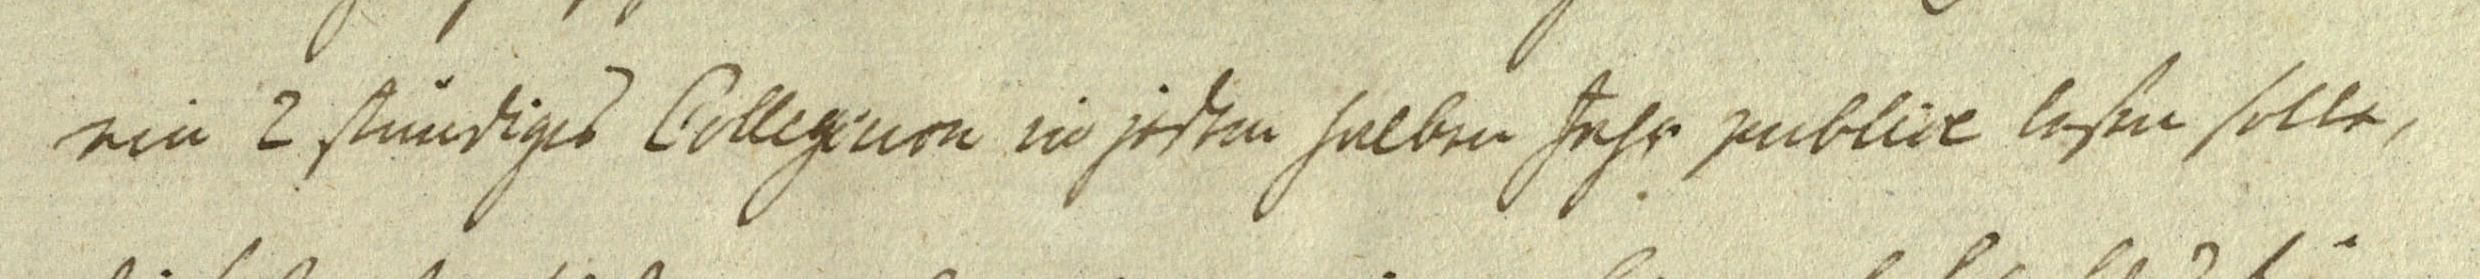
ein 2 stündiges Collegium in jedem halben Jahr publice lesen solle,
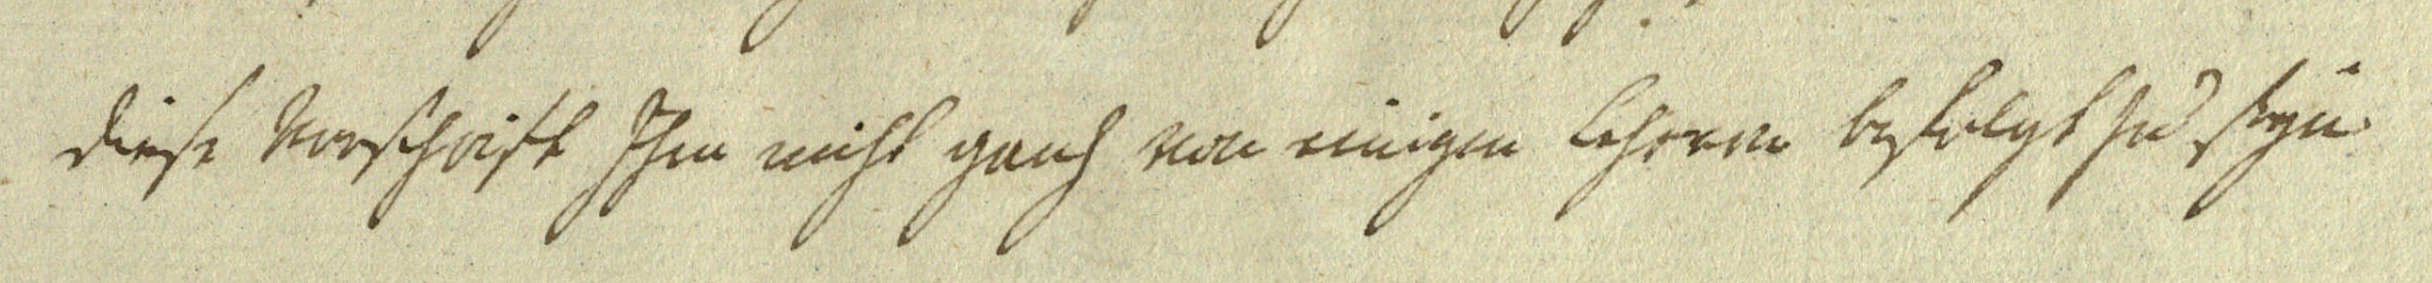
diese Vorschrift Ihm nicht ganz von einigen Lehrern befolgt zu seÿn
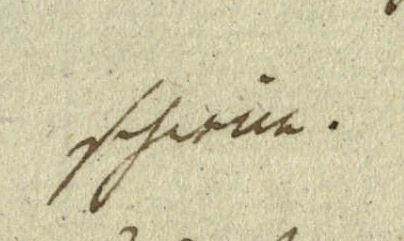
schiene.
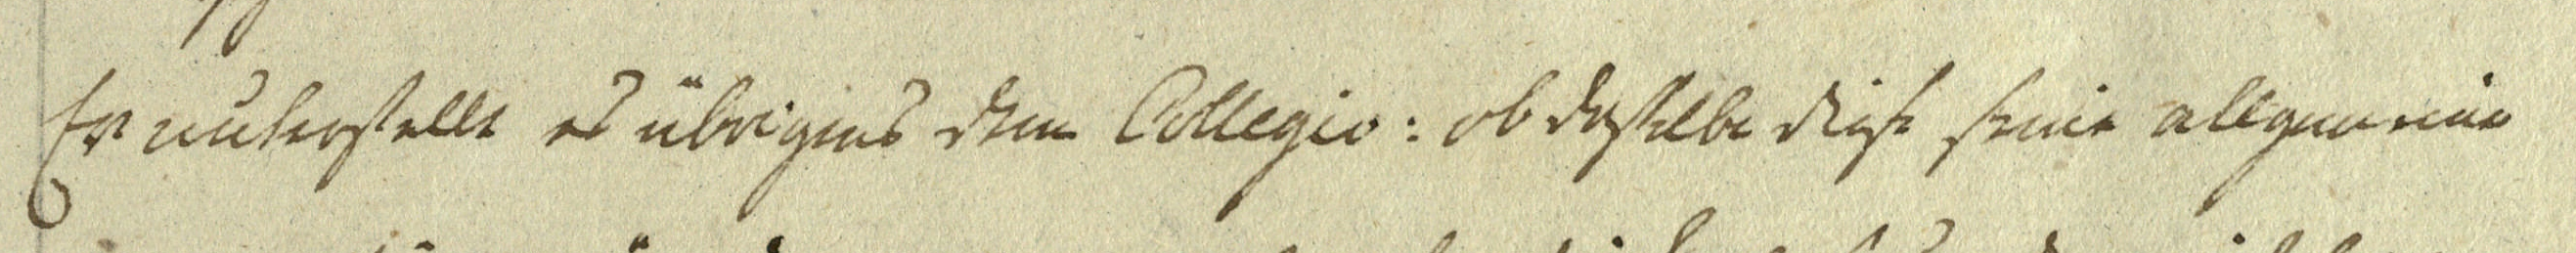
Er unterstelle es übrigens dem Collegio: ob dasselbe diese seine allgemeine
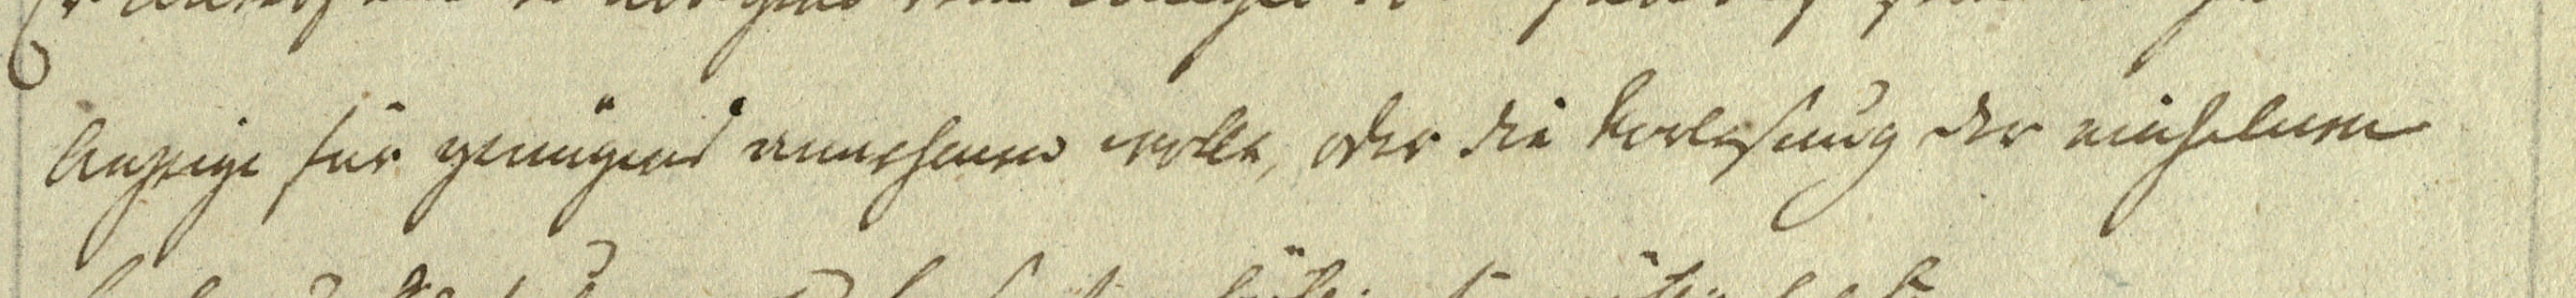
Anzeige für genügend annehmen wolle, oder die Vorlesung der einzelnen
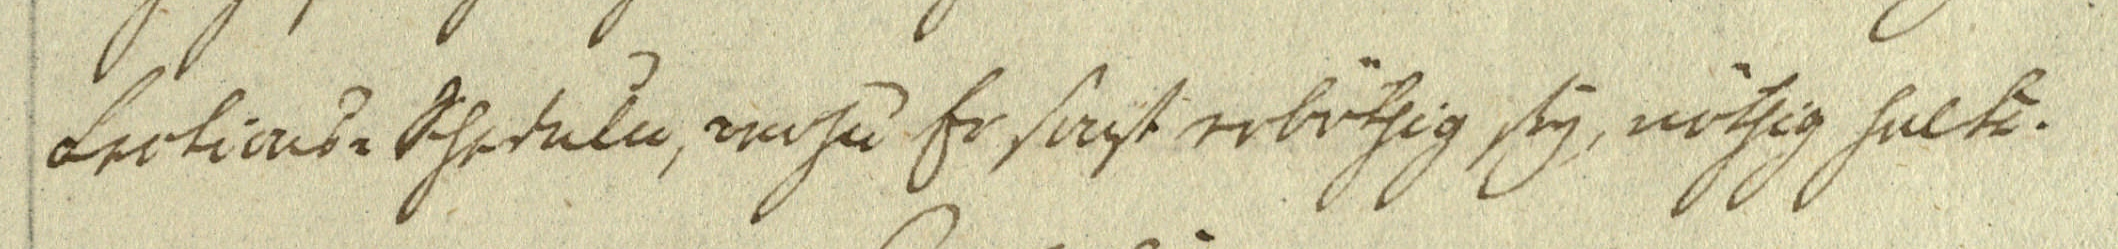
Lections. Scheduln, wozu Er sonst erböthig seÿ, nöthig halte.
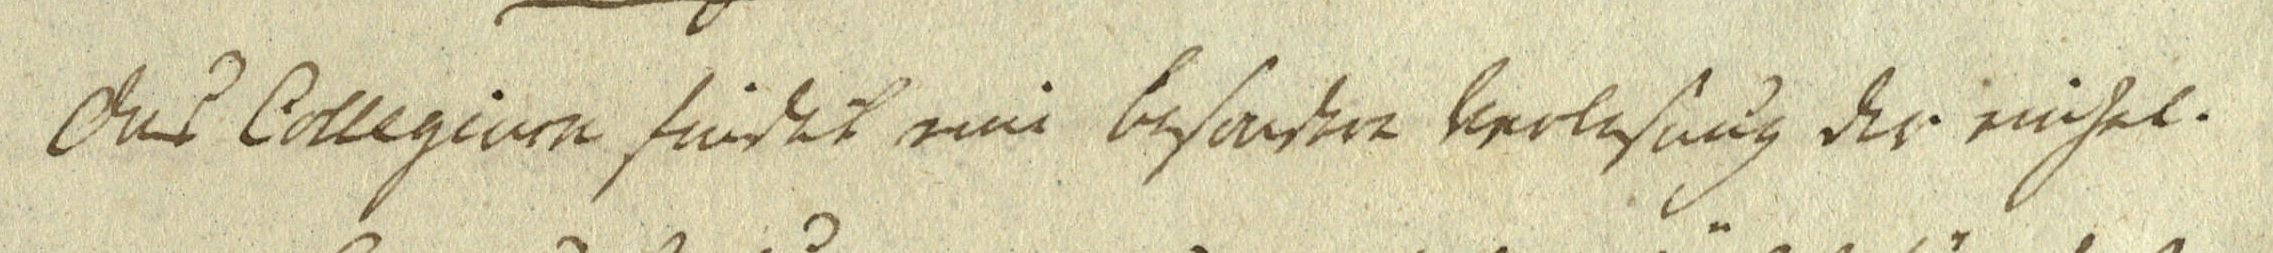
Das Collegium findet eine besondere Verlesung der einzel¬
